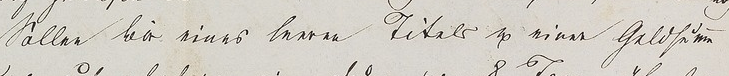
Sollen wir eines leeren Titels & einer Geldsumme
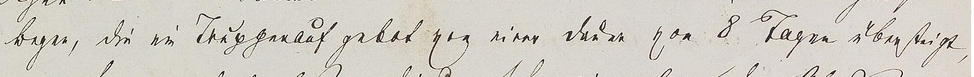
wegen, die ein Truppenaufgebot von einer Dauer von 8 Tagen übersteigt,
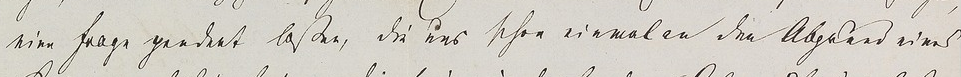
eine Frage pendant laßen, die uns schon einmal an den Abgrund eines
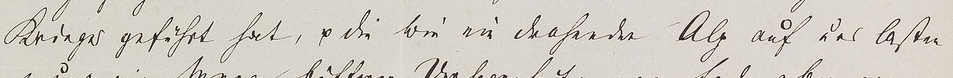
Krieges geführt hat, & die wie ein drohender Alp auf uns lasten
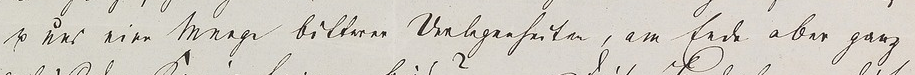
und uns eine Menge bitterer Vergelegenheiten, am Ende aber ganz
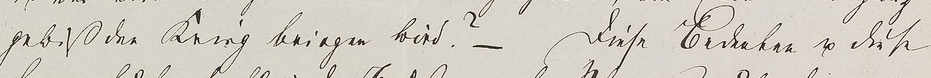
gewiß den Krieg bringen wird? – Diese Bedenken & diese
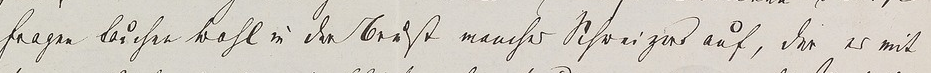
Fragen tauchen wohl in der Brust manches Schweizers auf, der es mit
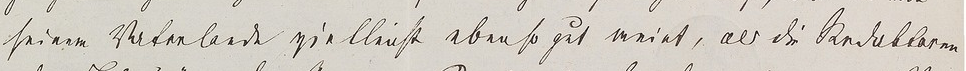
seinem Vaterlande vielleicht ebenso gut meint, als die Redaktoren
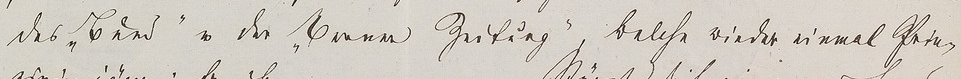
des «Bund» & der «Berner Zeitung», welche wieder einmal Prin-
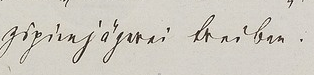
zipienjägerei treiben. –
